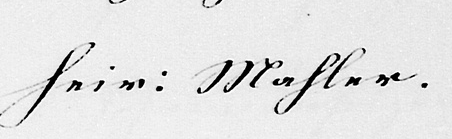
heir: Mahler.
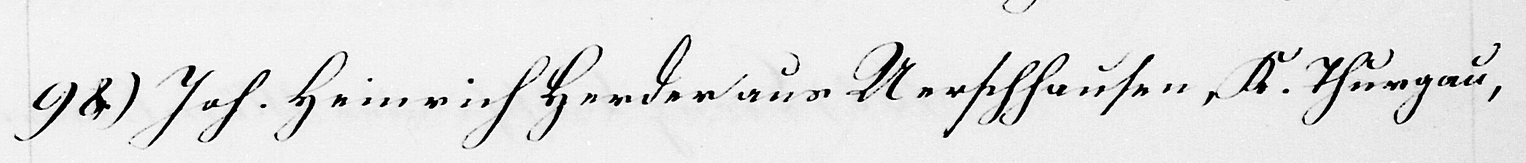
98.) Joh. Heinrich Herder aus Uerschhausen, K. Thurgau,
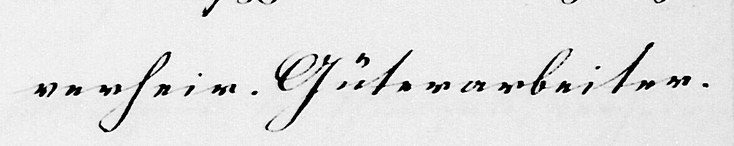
verheir. Güterarbeiter.
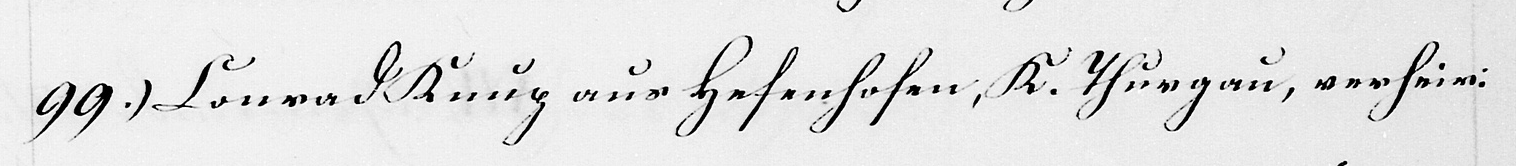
99.) Conrad Knup aus Hefenhofen, K. Thurgau, verheir:
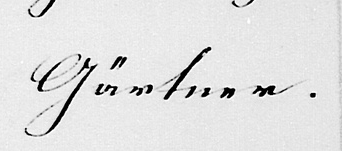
Gärtner.
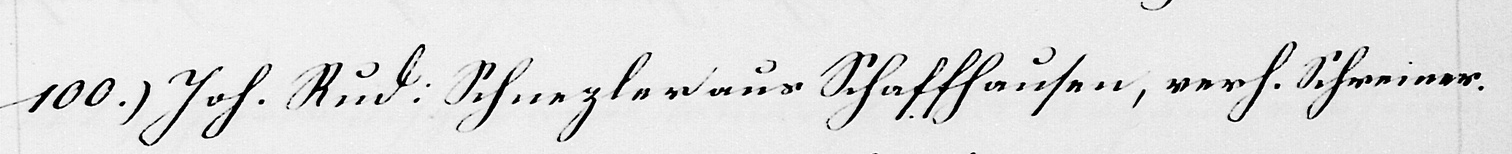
100.) Joh. Rud: Schnezler aus Schaffhausen, verh. Schreiner.
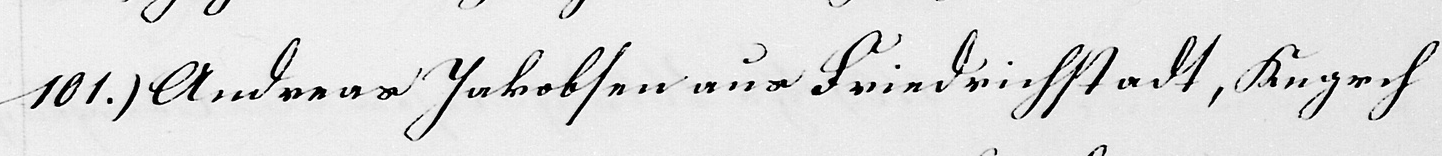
101.) Andreas Jakobsen aus Friedrichstadt, Kngrch
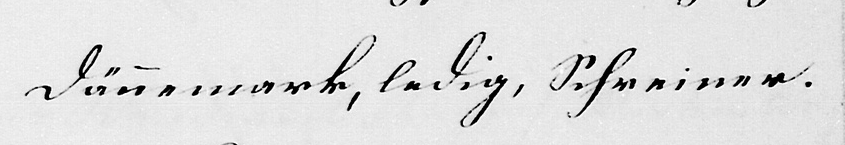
Dännemark, ledig, Schreiner.
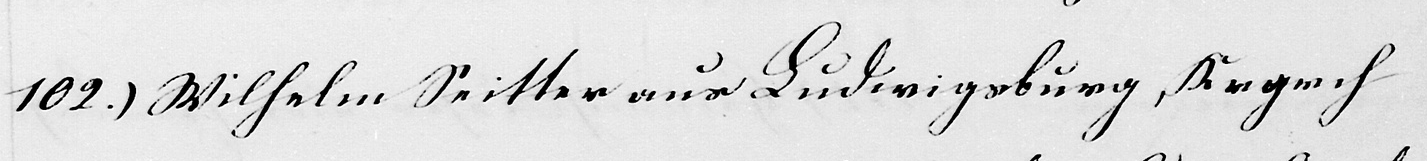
102.) Wilhelm Seitter aus Ludwigsburg, Kngrch
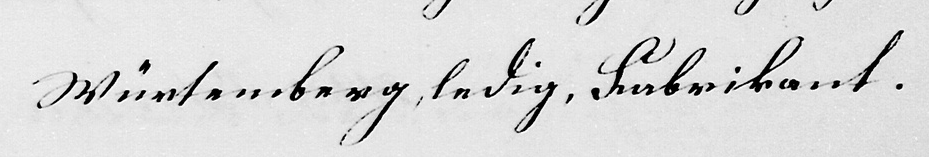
Würtemberg, ledig, Fabrikant.
